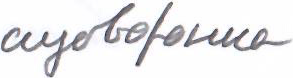сизоворонка
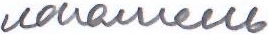лопатень
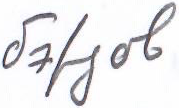бэрдов
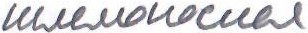шлемоносная
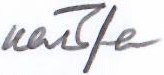кайра
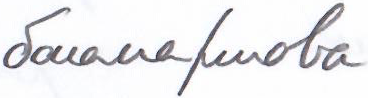бонапартова
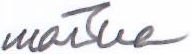майна
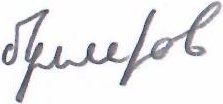буллеров
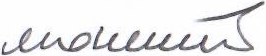японский
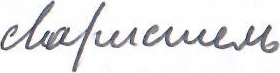свиристель
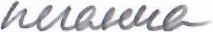пеганка
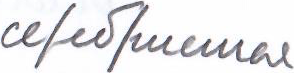серебристая
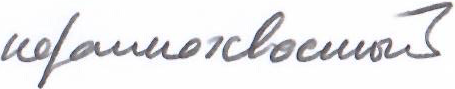короткохвостый
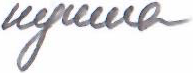кукша
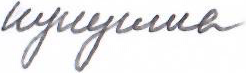кукушка
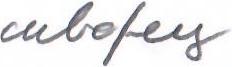скворец
